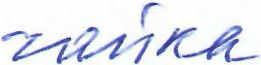чайка
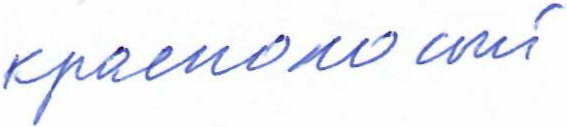красноносый
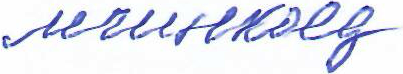личинкоед
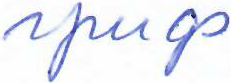гриф
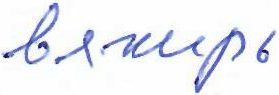вяхирь
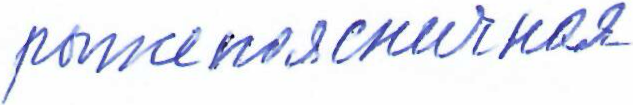рыжепоясничная
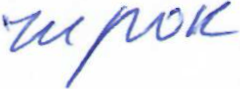чирок
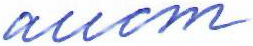аист
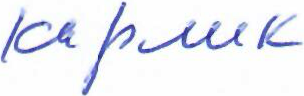карлик
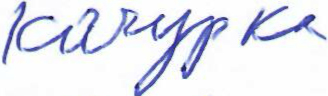качурка
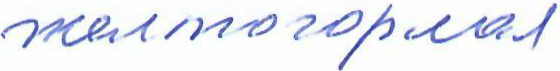желтогорлая
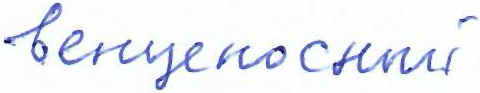венценосный
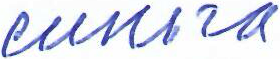синьга
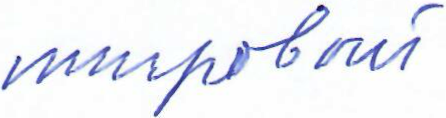тигровый
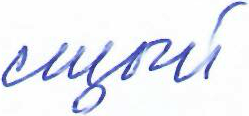сизый
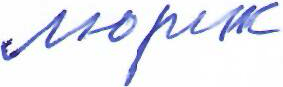люрик
